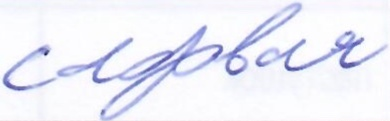садовая
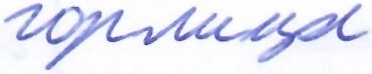горлица
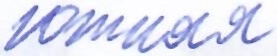южная
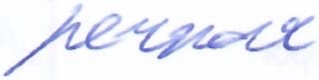речная
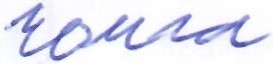чомга
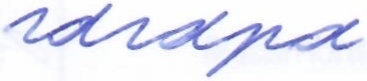гагара
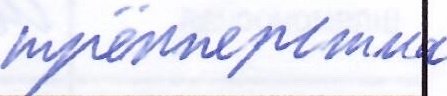трёхперстка
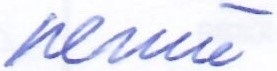пегий
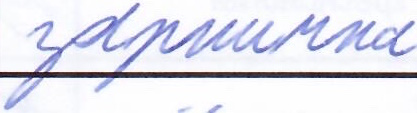зарничка
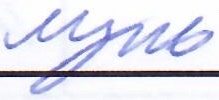лунь
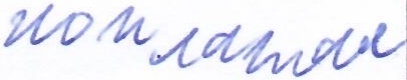хохлатая
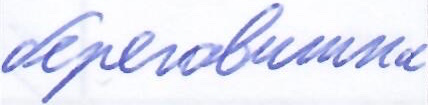береговишка
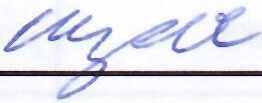сизая
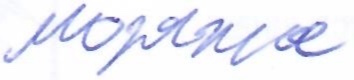морянка
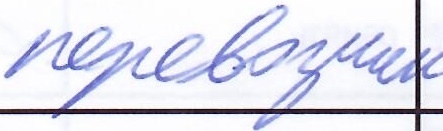перевозчик
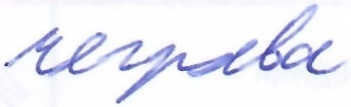чеграва
